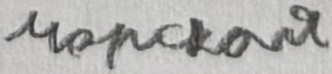морская
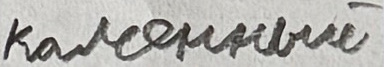каменный
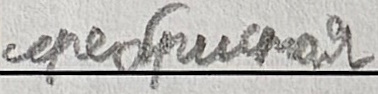серебристая
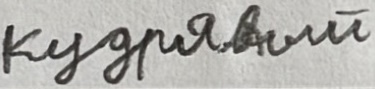кудрявый
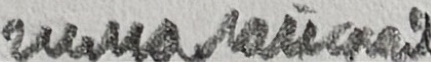гималайская
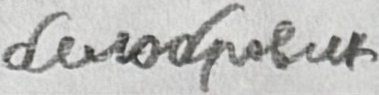белобровик
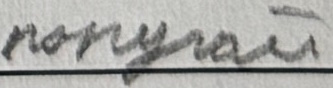попугай
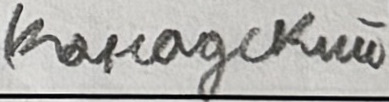канадский
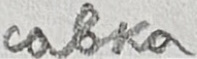савка
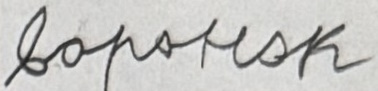воронок
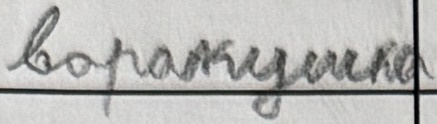воракушка
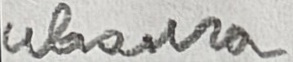иволга
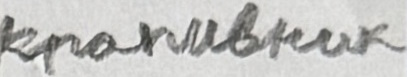крапивник
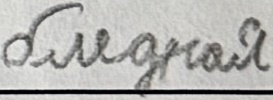бледная
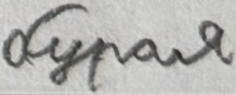бурая
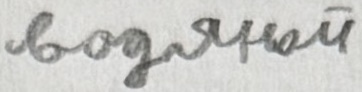водяной
